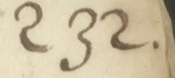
232.
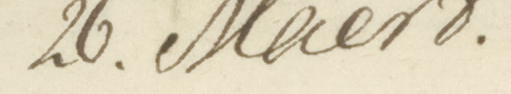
26. Maert.
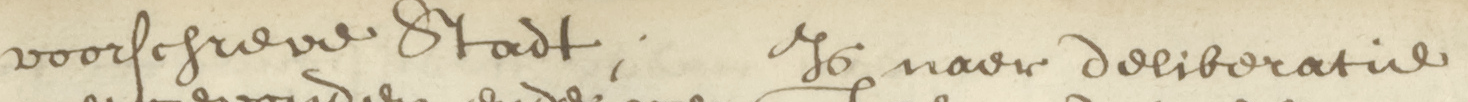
voorschreve Stadt; Is naer deliberatie
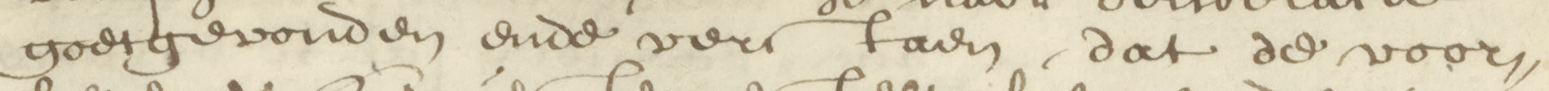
goetgevonden ende verstaen, dat de voor„
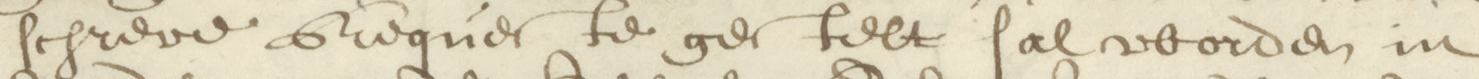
schreve Requeste gestelt sal worden in
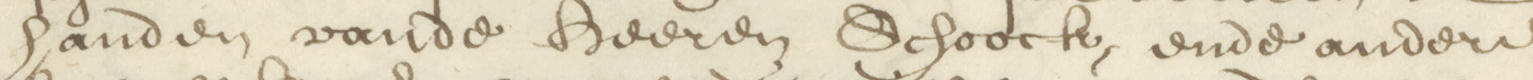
handen vande Heeren Schoock, ende andere
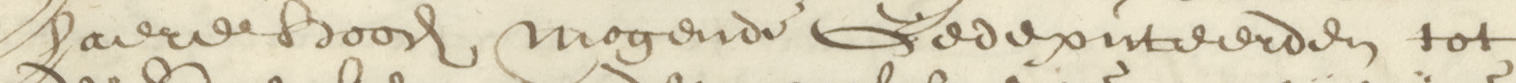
haere Hooch Mogende Gedeputeerden tot
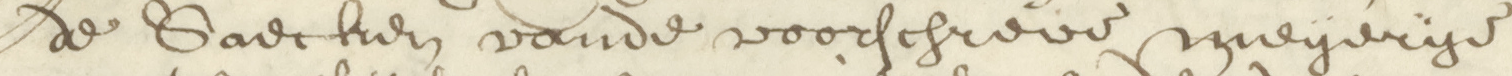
de Saecken vande voorschreve meijerije
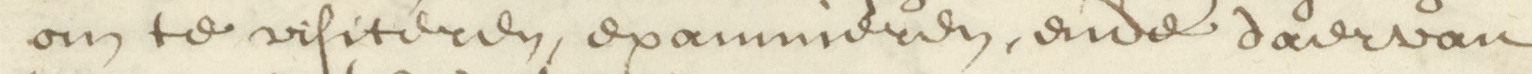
om te visiteren, examineren, ende daervan
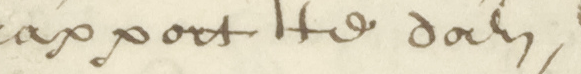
rapport te doen.
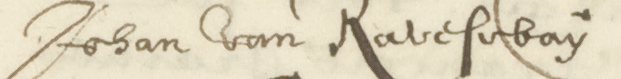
Johan van Ravesway
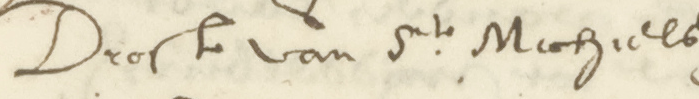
ca. Drost van St. Michiels„
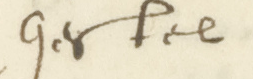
gestel
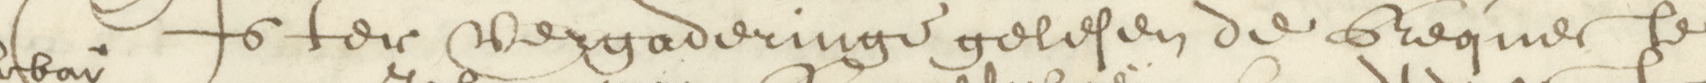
Is ter Vergaderinge gelesen de Requeste
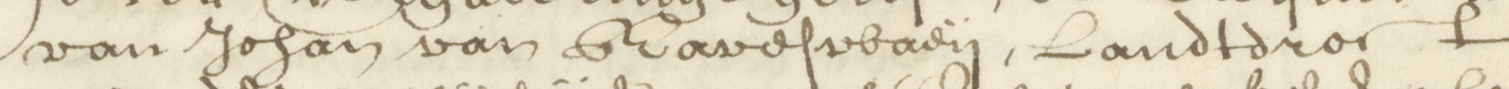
van Johan van Raveswaeij, Landtdrost
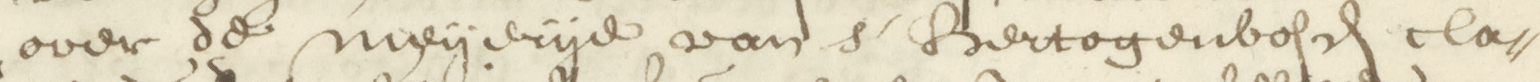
over de Meijerije van s' Hertogenbosch, cla,,
